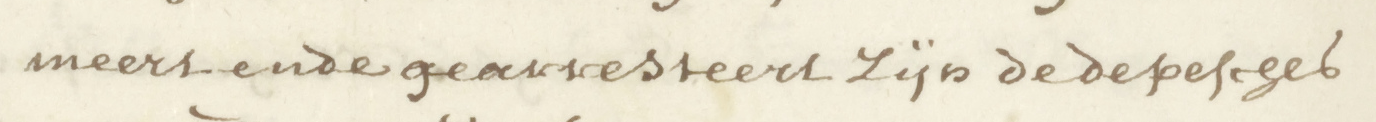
meert ende gearresteert zijn de depesches
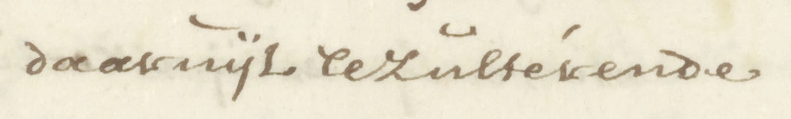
daaruijt rezulterende
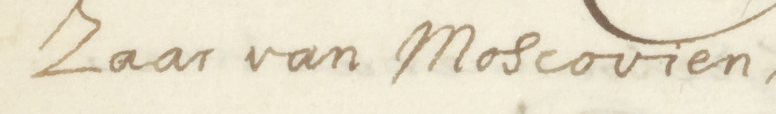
Zaar van Moscovien
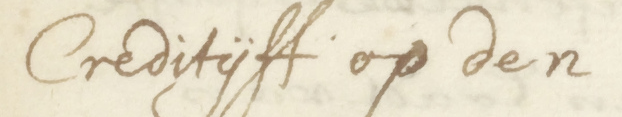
Creditijff op den
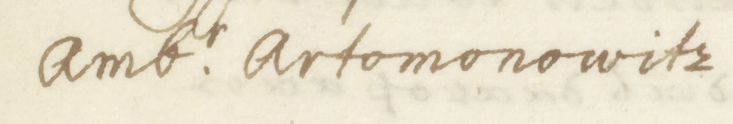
ambr. Artomonowitz
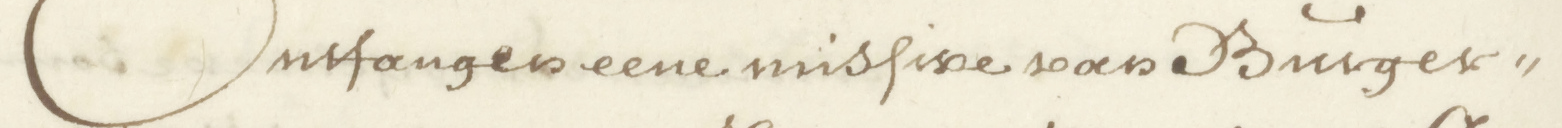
Ontfangen eene missive van Burger„,
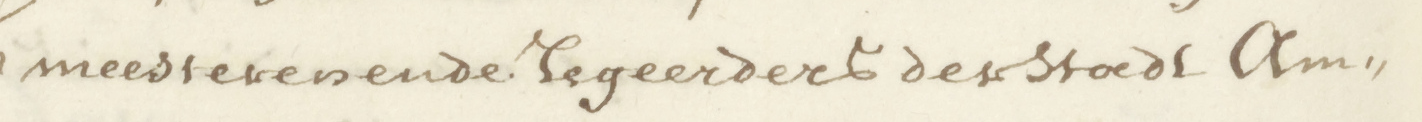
meesteren ende Regeerders der stadt Am„
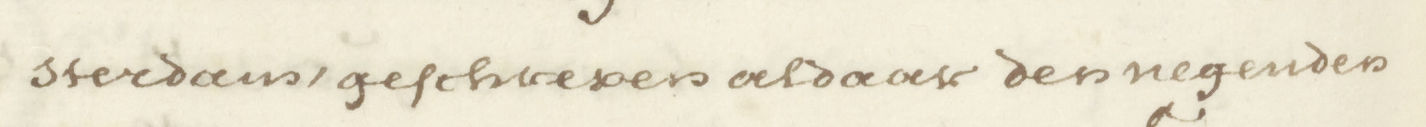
sterdam geschreven aldaar den negenden
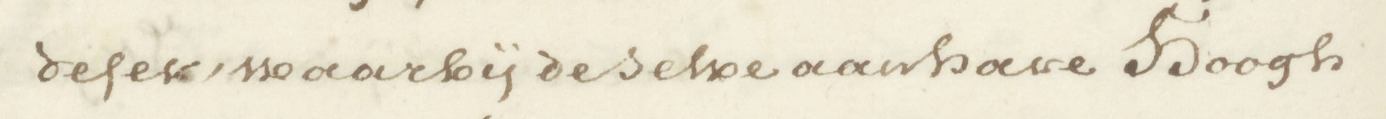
deser, waarbij deselve aan hare Hoogh
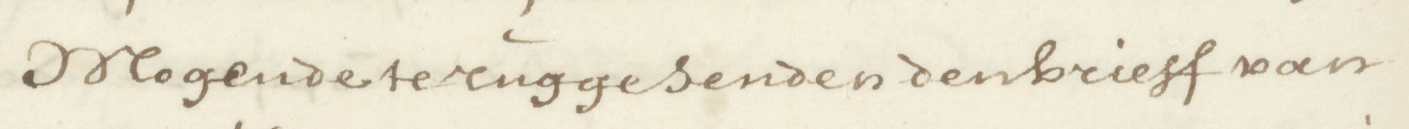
Mogende terugge senden den brieff van
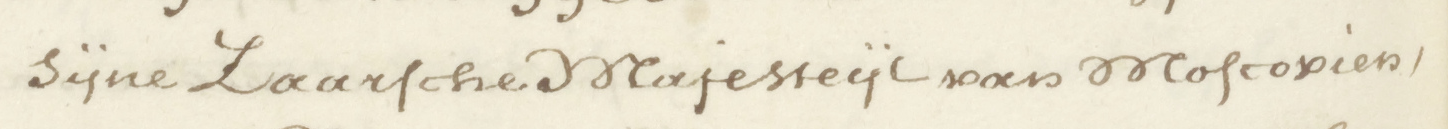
sijne Zaarsche Majesteijt van Moscovien,
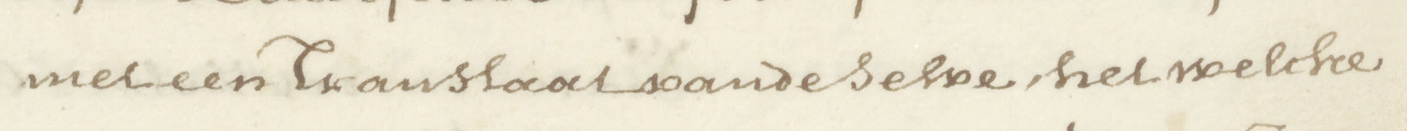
met een Translaat van deselve, het welcke
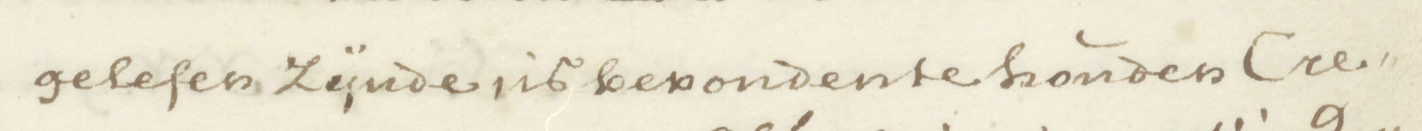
gelesen zijnde, is bevonden te houden Cre,,
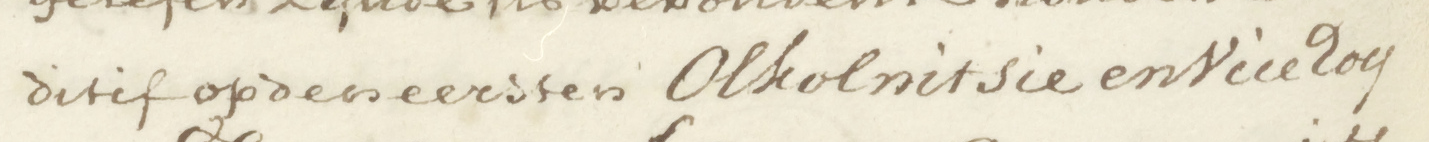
ditif opden eersten Olkolnitsie en Viceroij
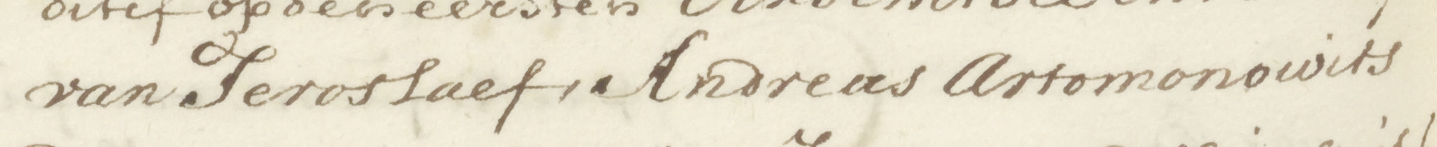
van Teroslaef, Andreas Artomonowits
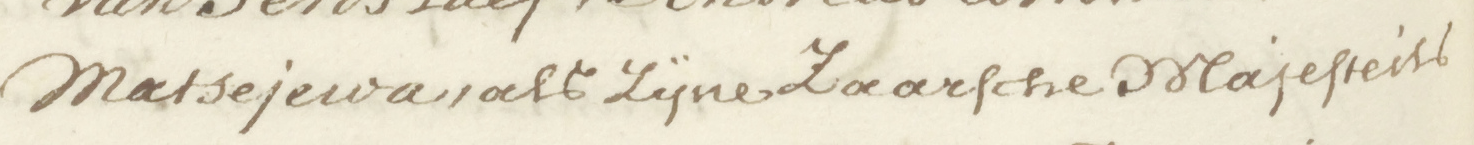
Matsejewa, als zijne Zaarsche Majesteits
